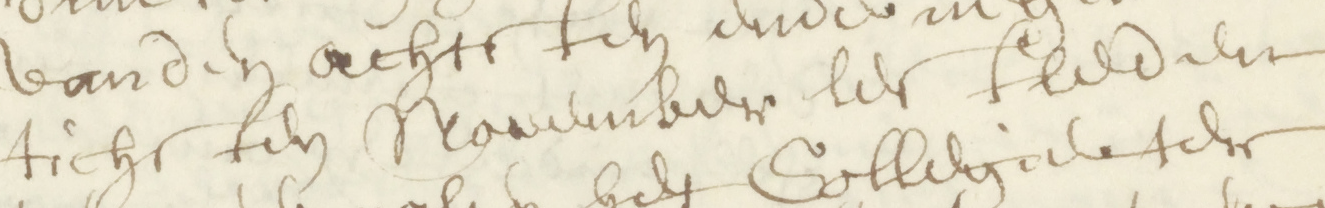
tichsten November lestleden
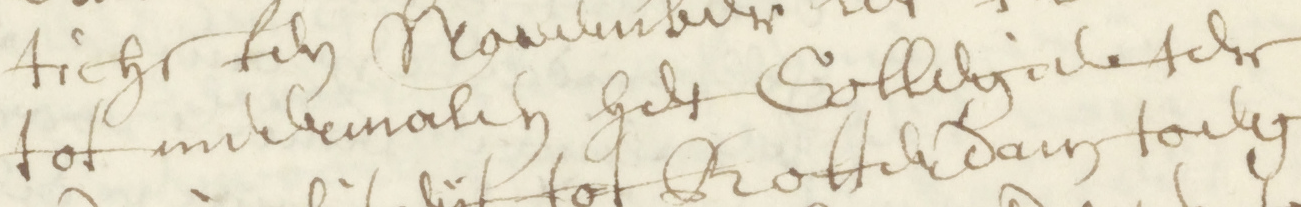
tot meermalen het Collegie ter
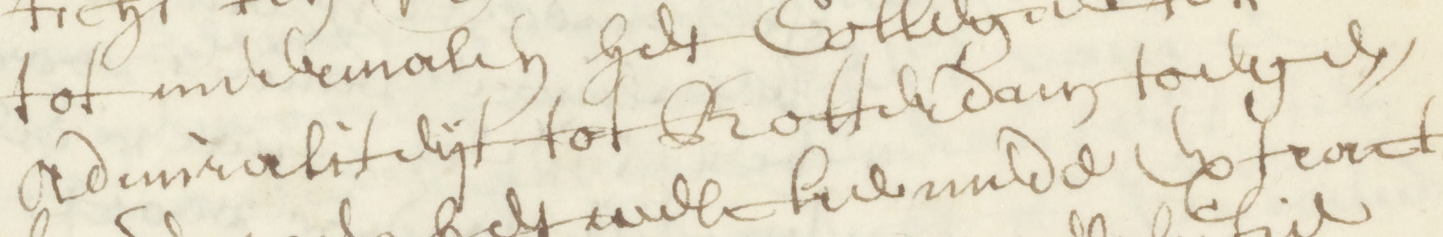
Admiraliteijt tot Rotterdam toege,,
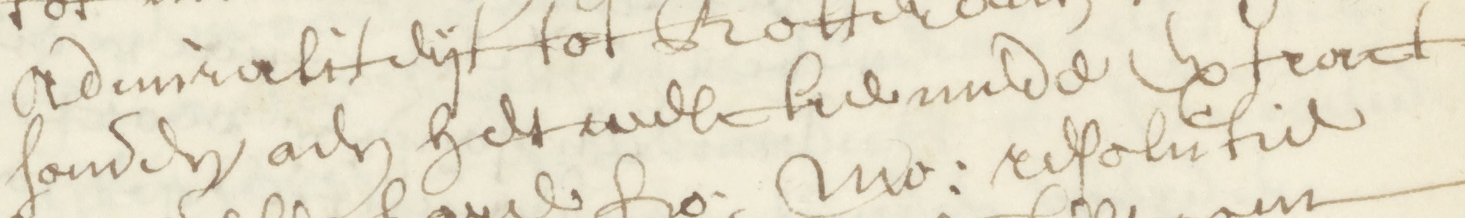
sonden, aen het welcke mede Extract
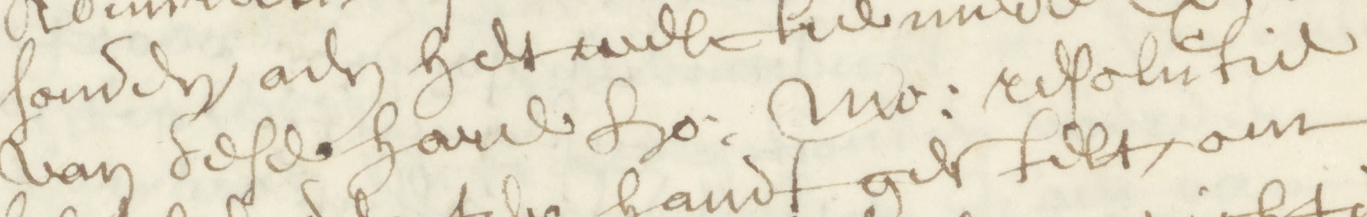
van dese hare Ho:Mo: resolutie
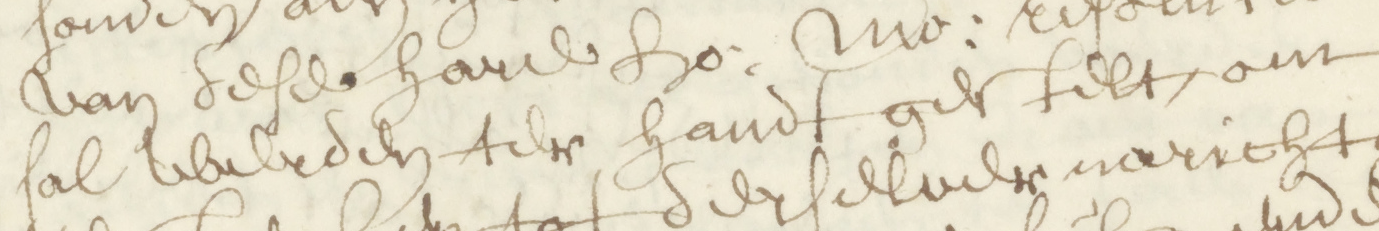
sal werden ter handt gestelt, om
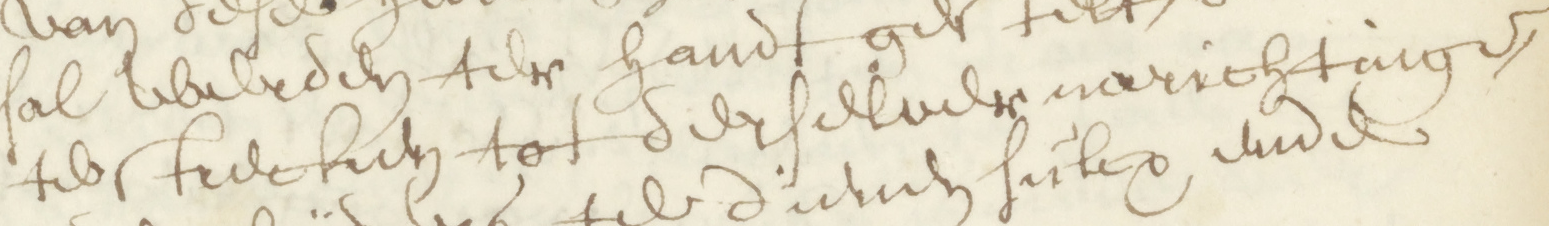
te strecken tot derselver narichtinge
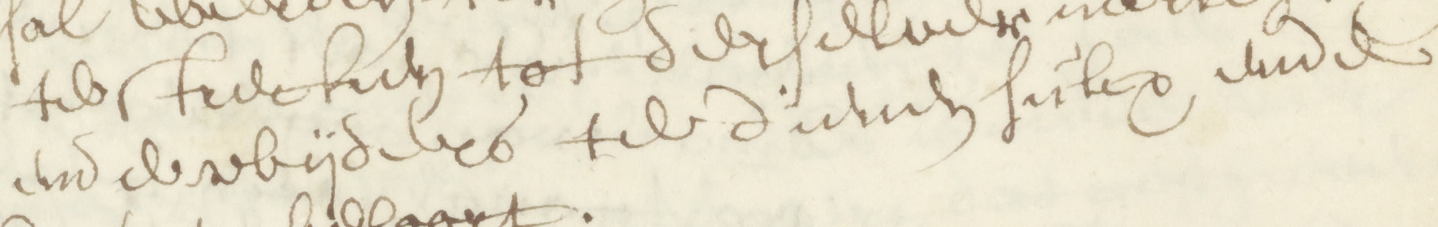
ende wijders te dienen sulcx, ende
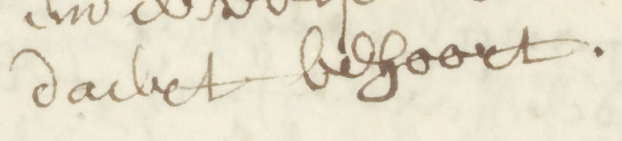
daert behoort.
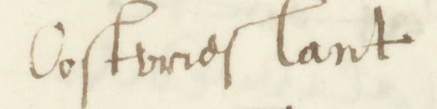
Oostvrieslant
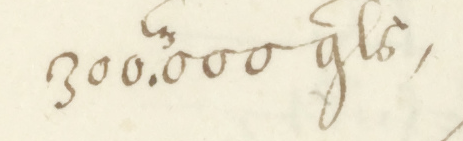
300.000 gls.
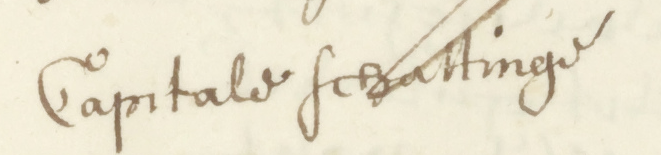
Capitale schattinge
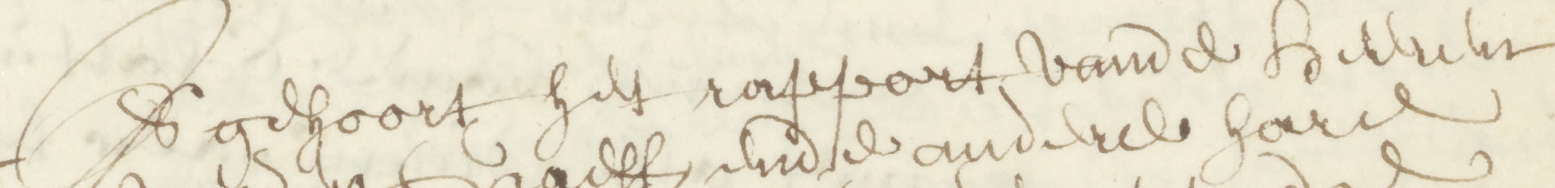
Is gehoort het rapport vande Heeren
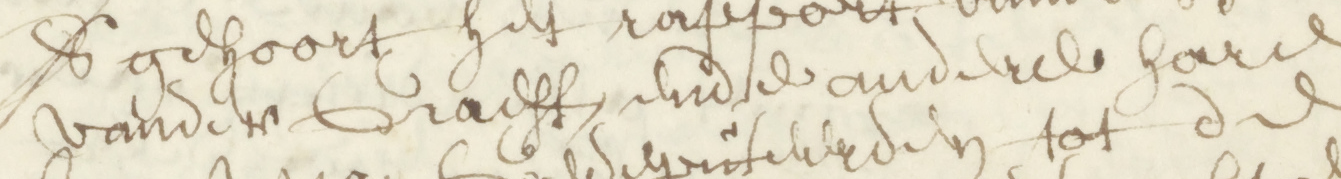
vander Graeff, ende andere hare
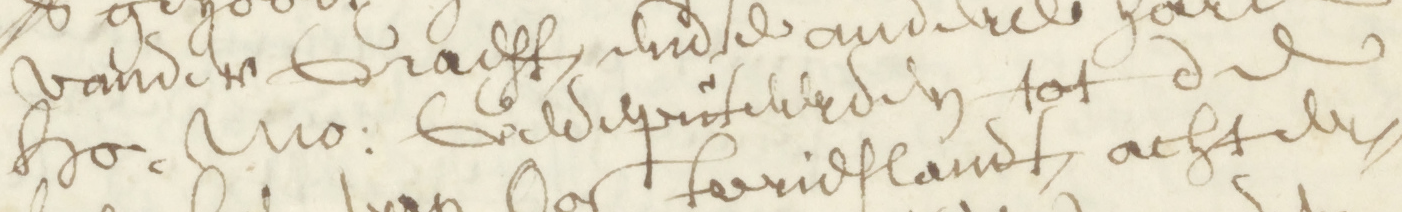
Ho:Mo: Gedeputeerden tot de
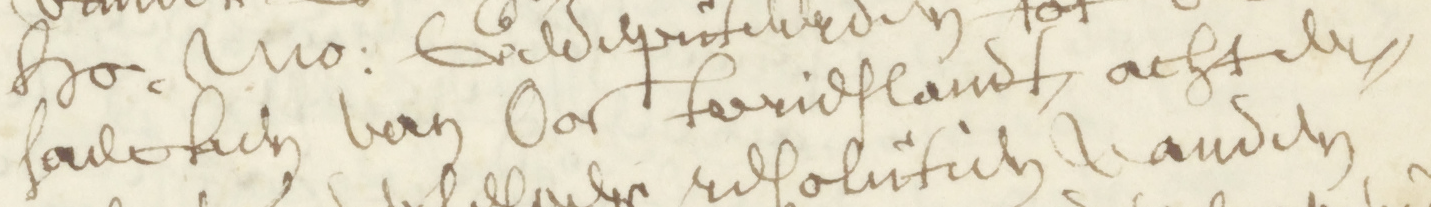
saecken van Oostvrieslandt, achter„
